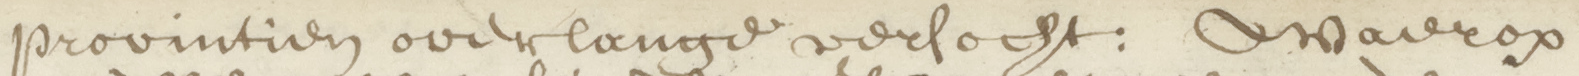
provintien over lange versocht: Waerop
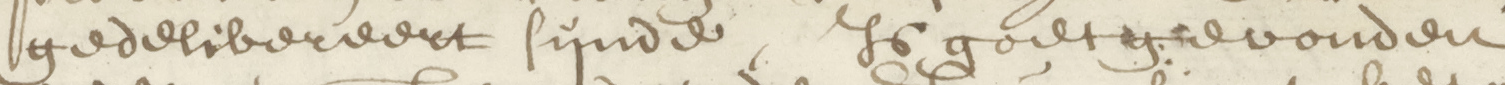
gedelibeert sijnde, Is goetgevonden
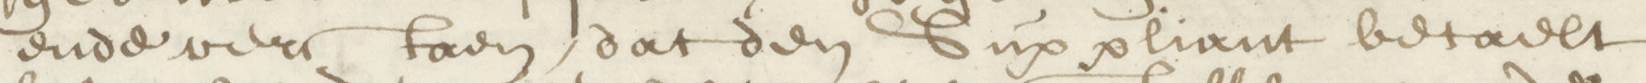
ende verstaen, dat den suppliant betaelt
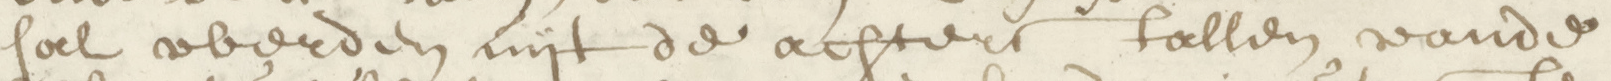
sal werden uijt de achterstallen vande
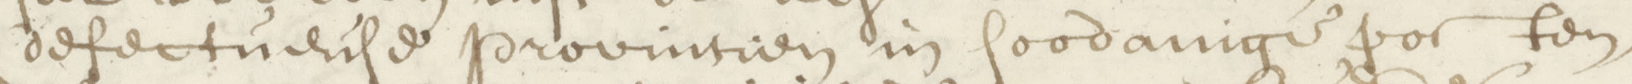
defectueuse provintien in soodanige posten,
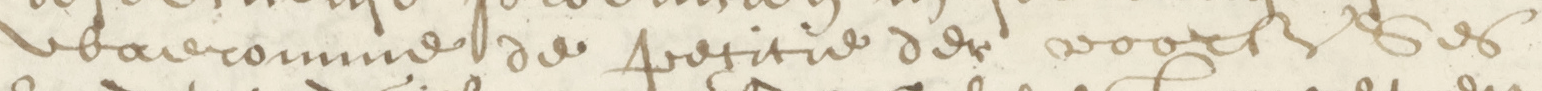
waeromme de petitie der voors ses
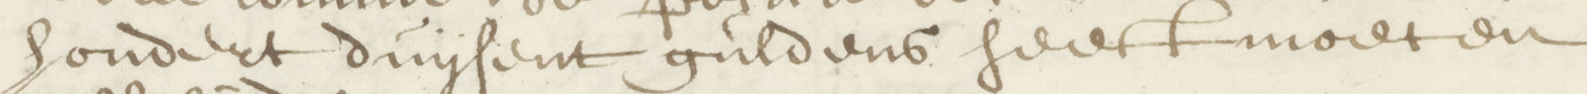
hondert duijsent guldens heeft moeten
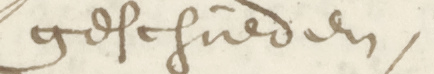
geschieden.
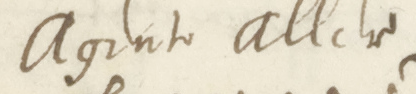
Agent Aller
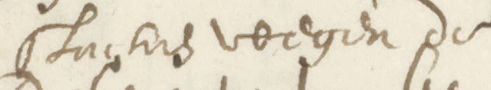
stucken wegen de
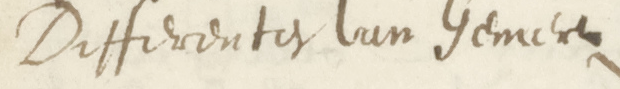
Differenten van Gemert
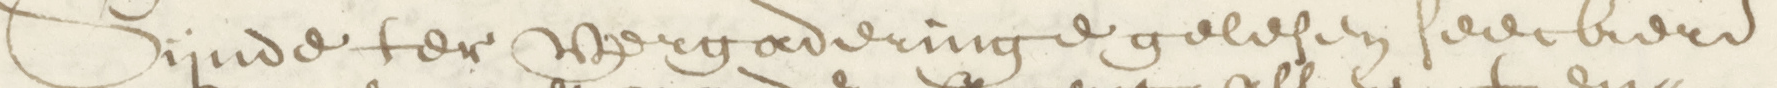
Sijnde ter vergaderinge gelesen seeckere
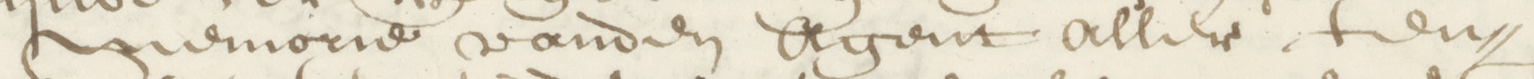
memorie vanden agent Aller ten„
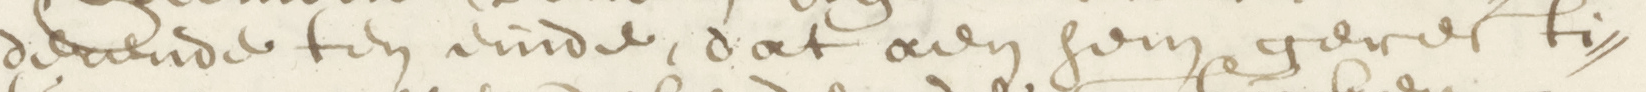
derende ten einde, dat aen hem geresti„
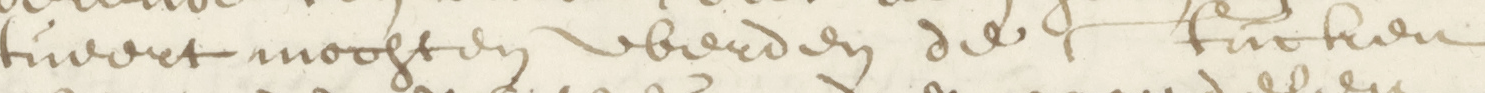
tueert mochten worden de stucken
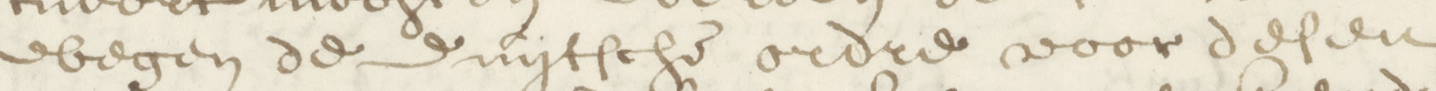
wegen de duijtsche orde voor desen
